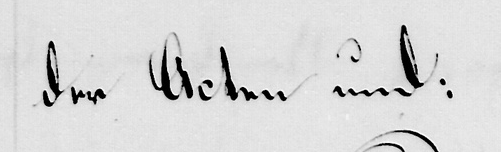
der Acten und:
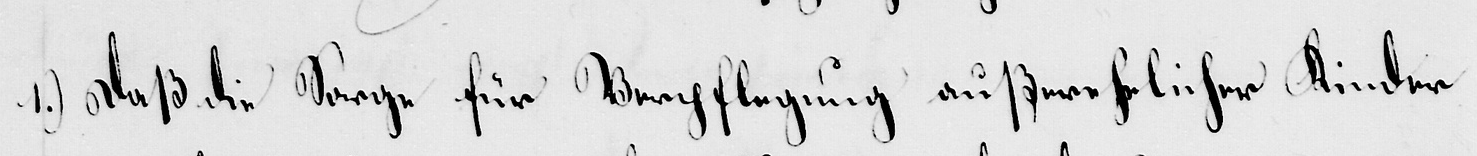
1.) Daß die Sorge für Verpflegung außerehelicher Kinder
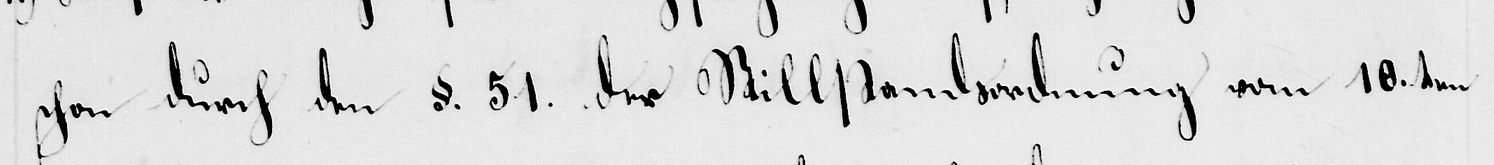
schon durch den §. 51. der Stillstandsordnung vom 10.ten
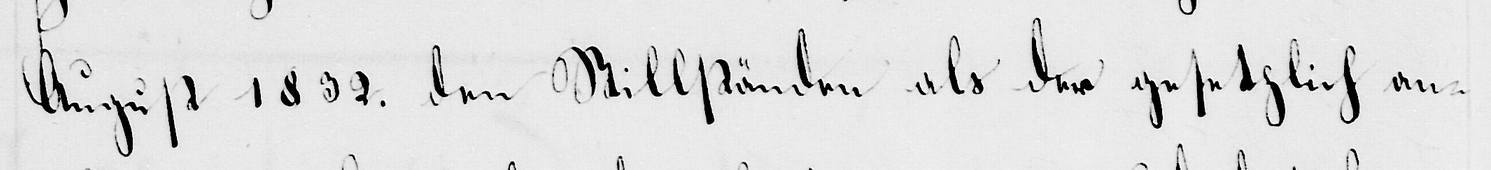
August 1832. den Stillständen als der gesetzlich an¬
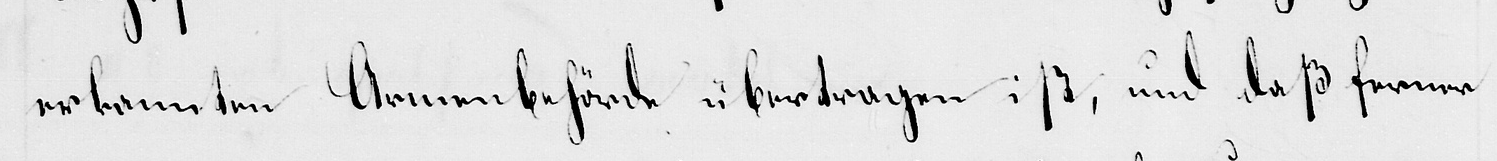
erkannten Armenbehörde übertragen ist, und daß ferner
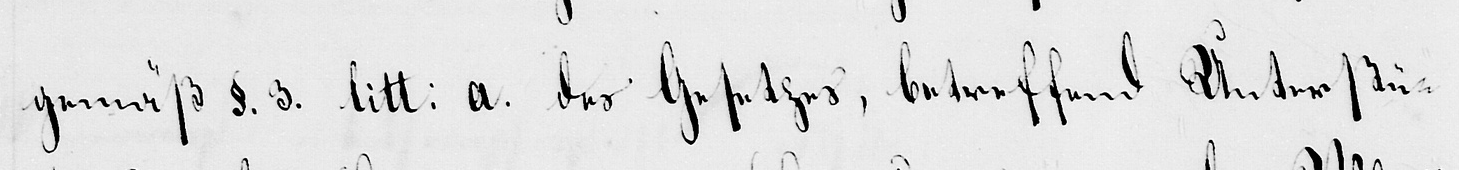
gemäß §. 3. litt: a. des Gesetzes, betreffend Unterstü¬
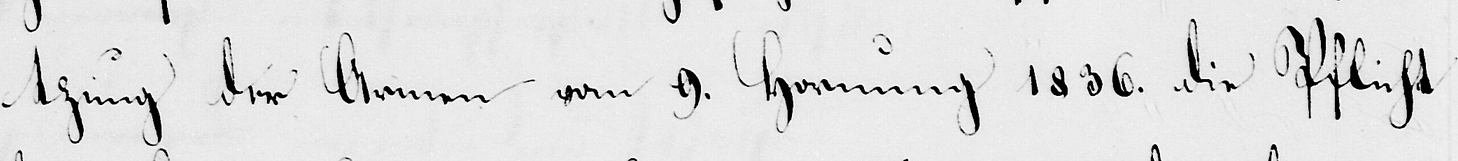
tzung der Armen vom 9. Hornung 1836. die Pflicht
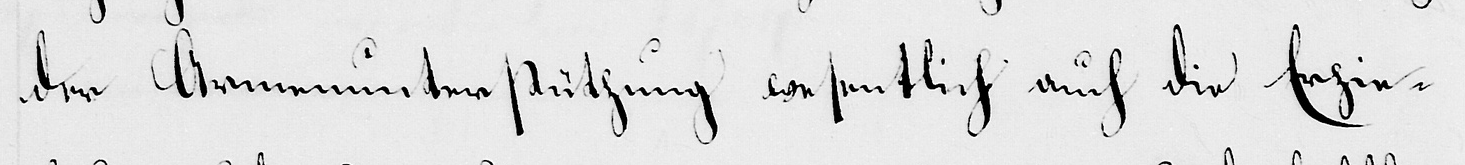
der Armenunterstützung wesentlich auch die Erzie¬
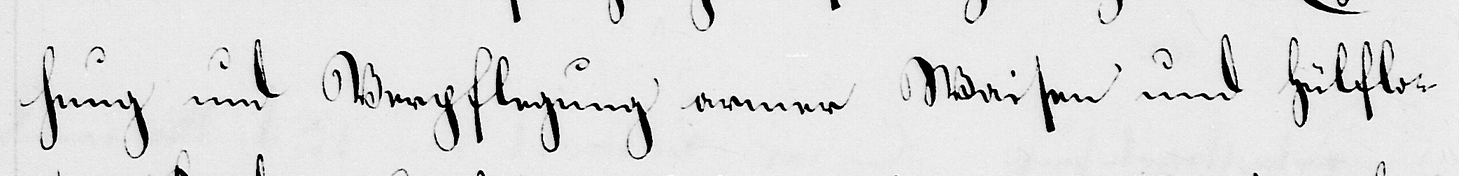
hung und Verpflegung armer Waisen und hülflo¬
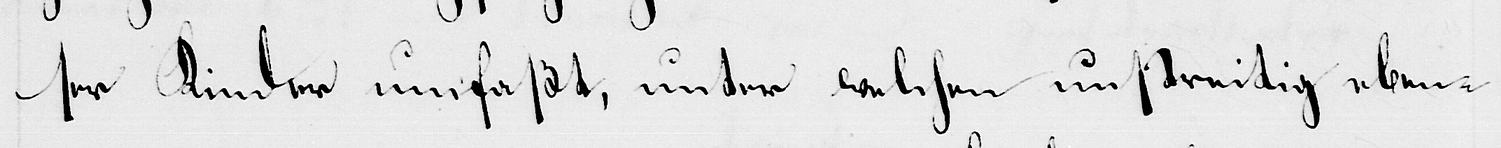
ser Kinder umfaßt, unter welchen unstreitig eben¬
